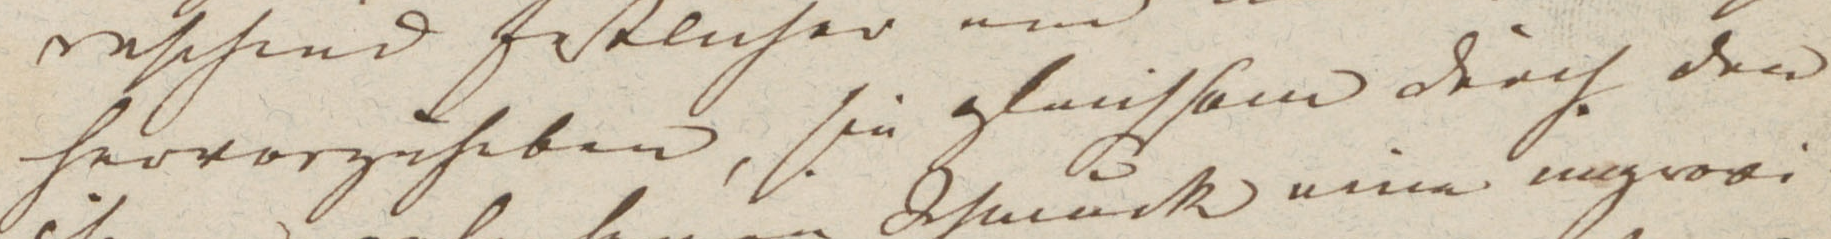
hervorzuheben, sie gleichsam durch den
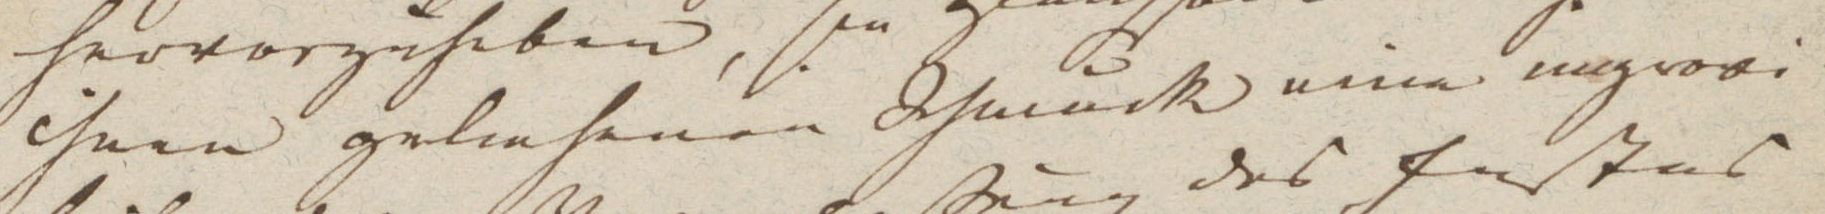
ihnen geliehenen Schmuck eine improvi-
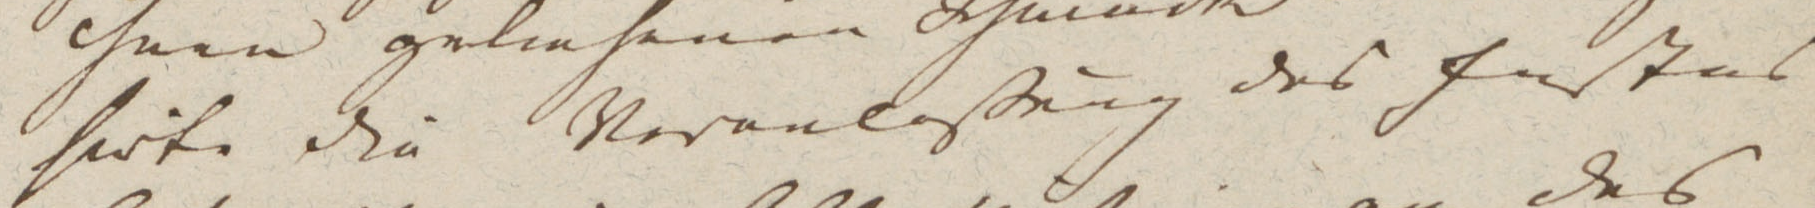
sirte die Veranlassung des Festes
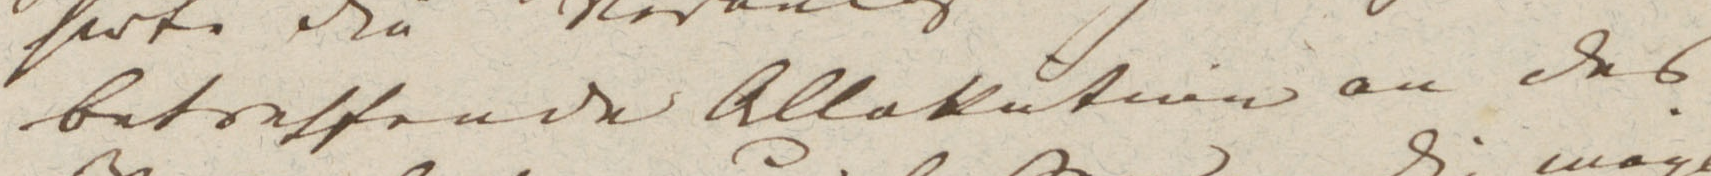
betreffende Allokution an das
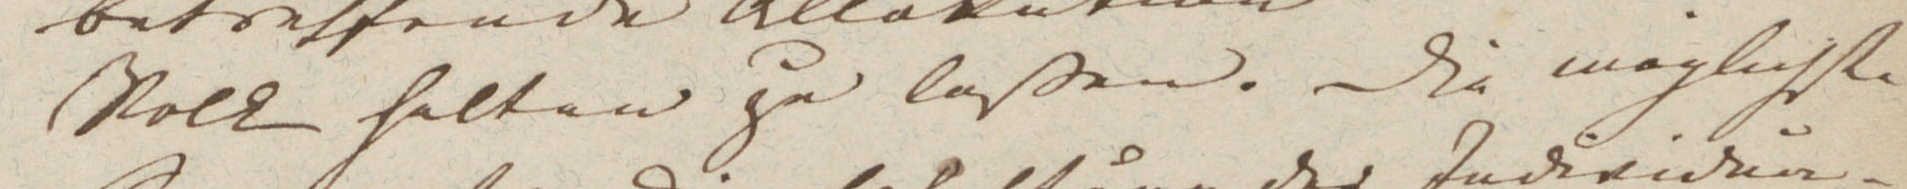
Volk halten zu lassen. Die möglichste
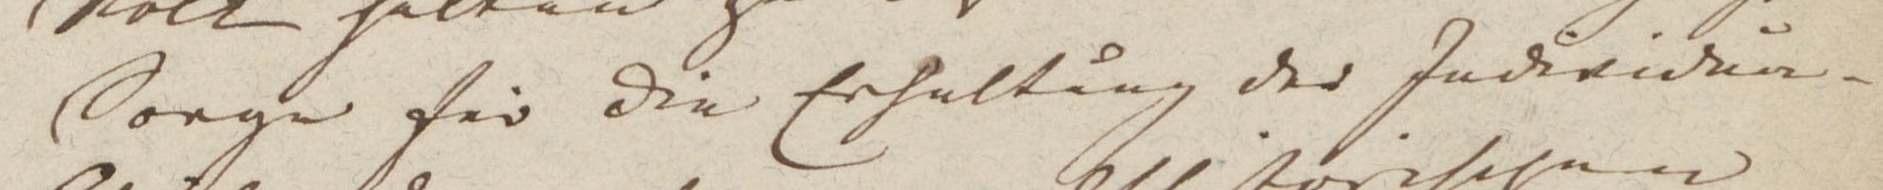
Sorge für die Erhaltung der Individua-
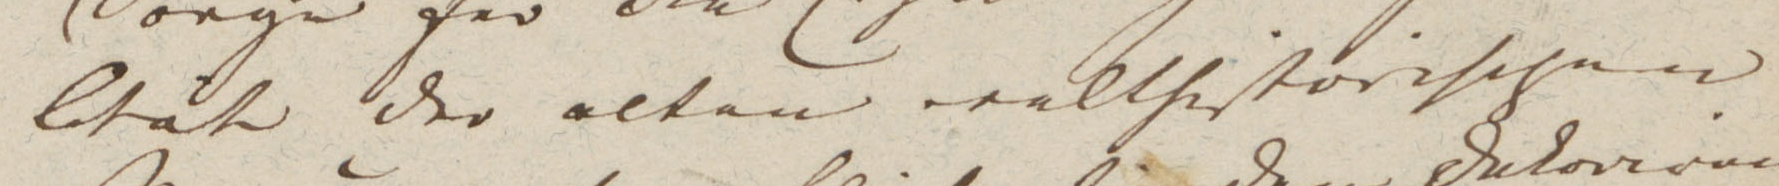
lität der alten welthistorischen
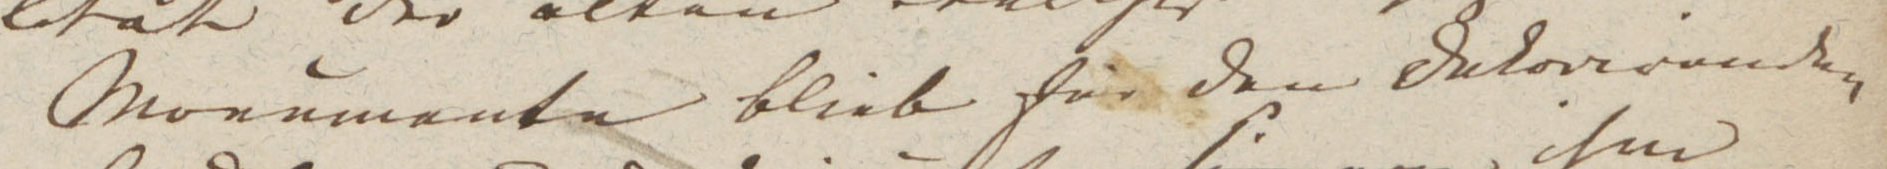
Monumente blieb für den dekorirenden
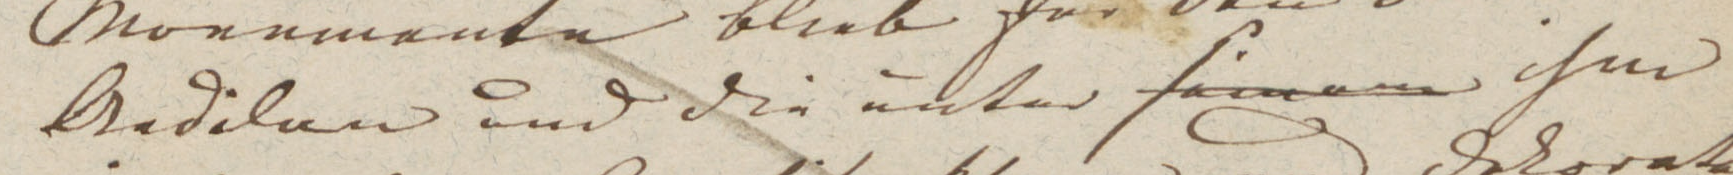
Aedilen und die unter seinem ihm
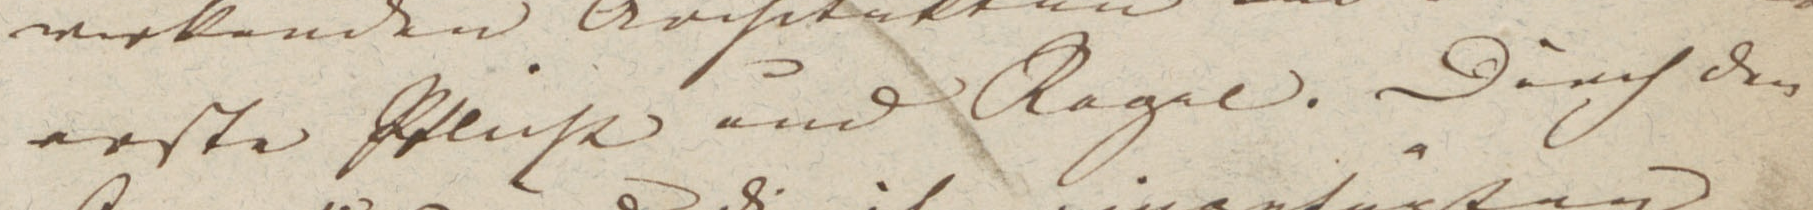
erste Pflicht und Regel. Durch den
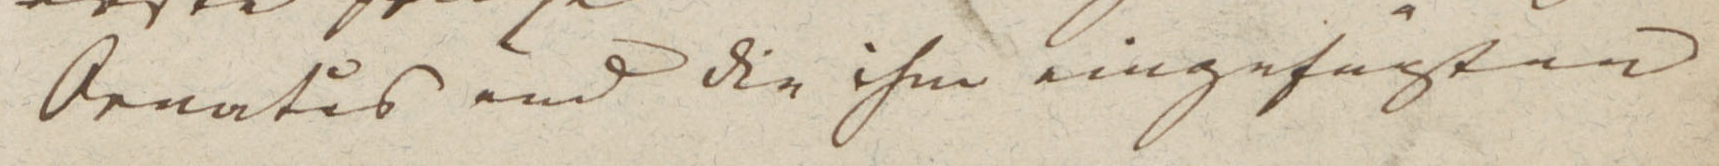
Ornatus und die ihm eingefügten
